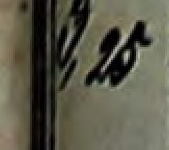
3,25
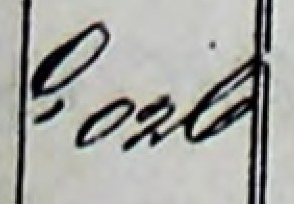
0,026
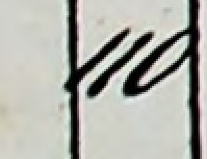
110
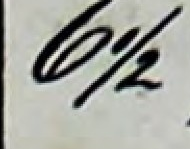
6 ½
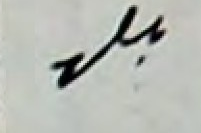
do
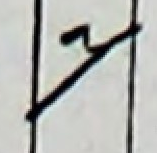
7
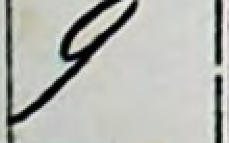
9
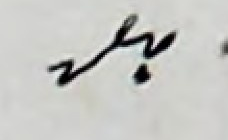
do
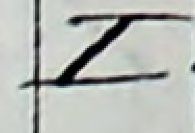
I
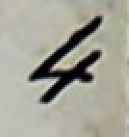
4
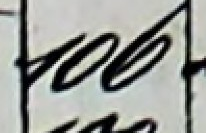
106
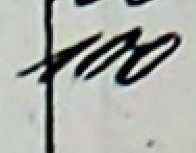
100
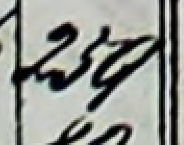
259
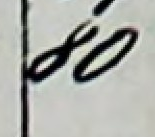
80
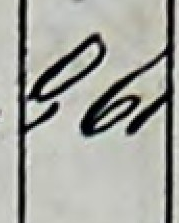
0,61
